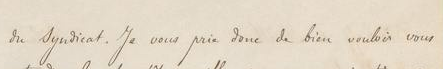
du Syndicat. Je vous prie donc de bien vouloir vous
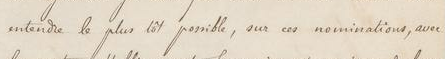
entendre le plus tôt possible, sur ces nominations, avec
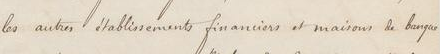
les autres établissements financiers et maisons de banque
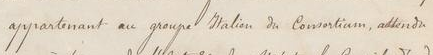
appartenant au groupe Italien du Consortium, attendu
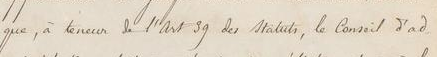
que, à teneur de l'Art 39 des Statuts, le Conseil d'ad-
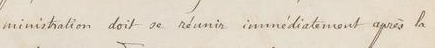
ministration doit se réunir immédiatement après la
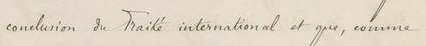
conclusion du Traité international et que, comme
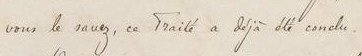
vous le savez, ce Traité a déjà été conclu.
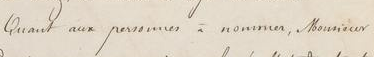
Quant aux personnes à nommer, Monsieur
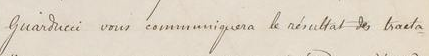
Guarducci vous communiquera le résultat des tracta-
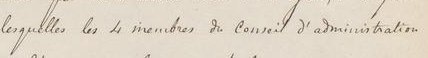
lesquelles les 4 membres du Conseil d'administration
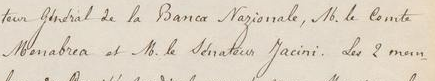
Menabrea et M. le Sénateur Jacini. Les 2 mem-
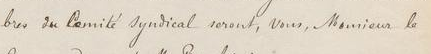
bres du Comité syndical seront, vous, Monsieur le
